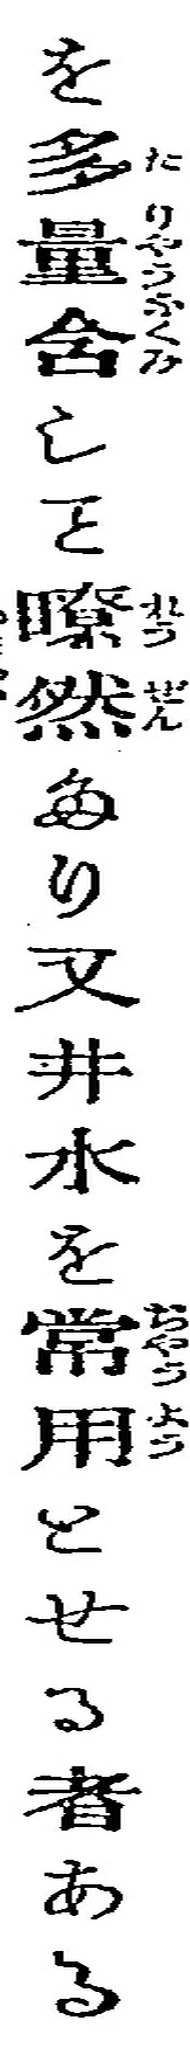を多量含しこと瞭然たり又井水を常用とせる者ある
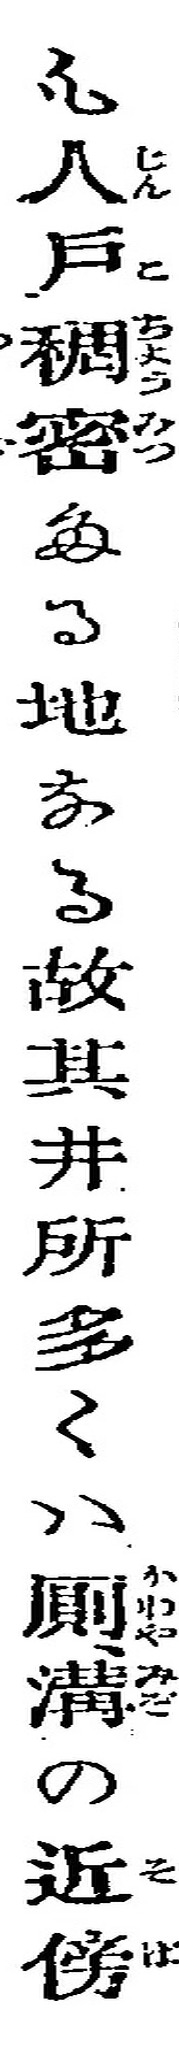も人戸稠密たる地なる故其井所多くは厠、溝の近傍
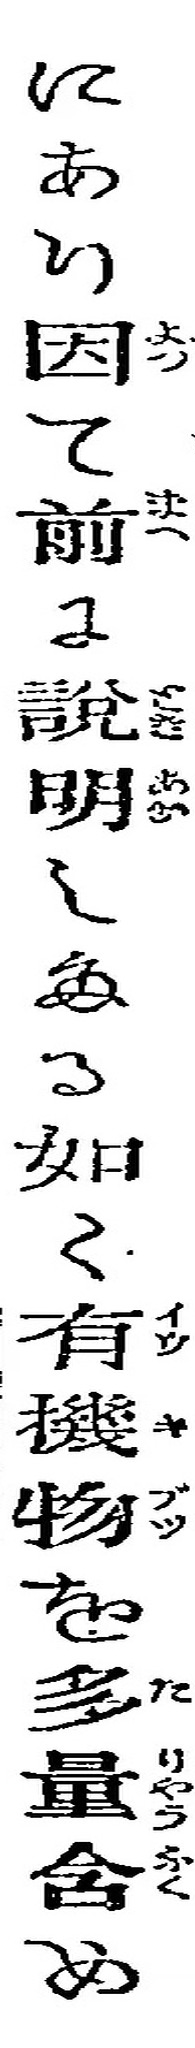にあり因て前に説明したる如く有機物を多量含め
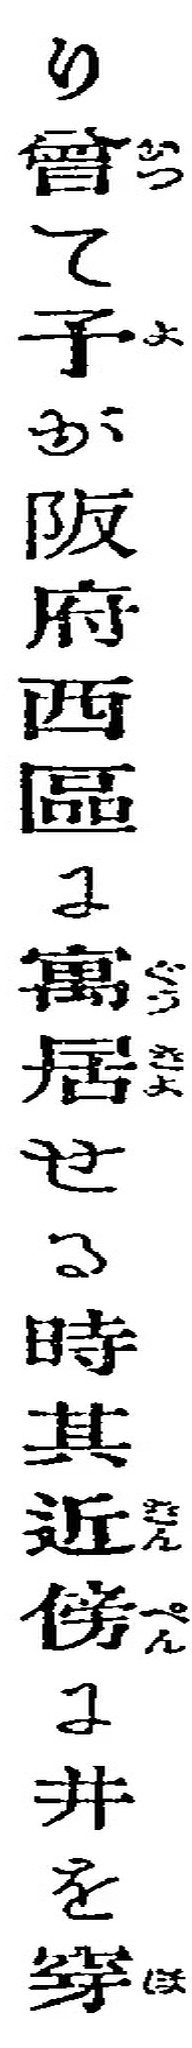り曾て予が坂府西区に寓居せる時其近傍に井を穿
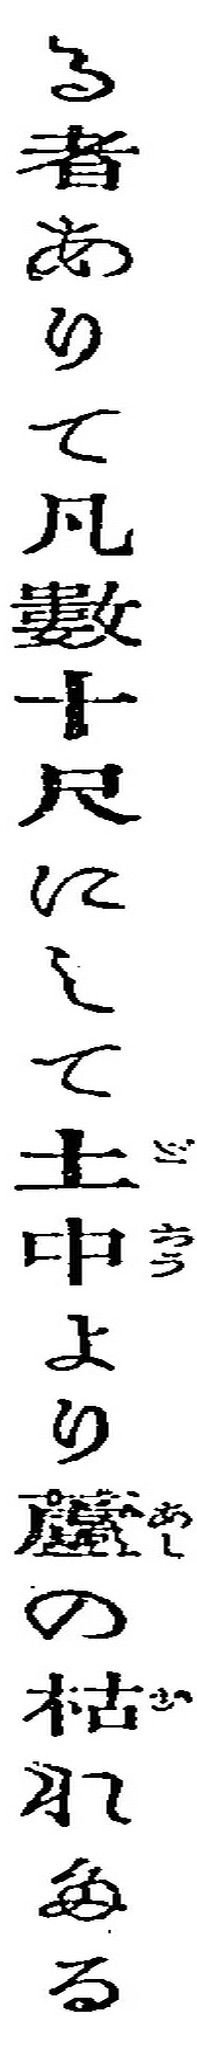る者ありて凡数十尺にして土中より蘆の枯れたる
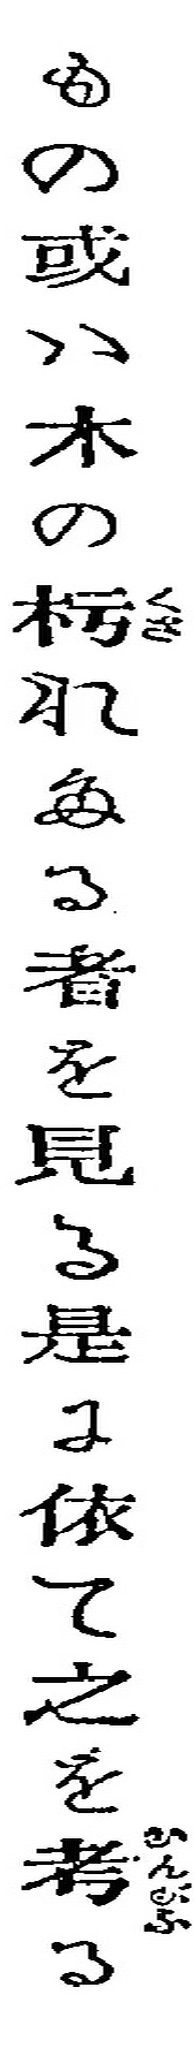もの或は木の朽れたる者を見る是に依て之を考る
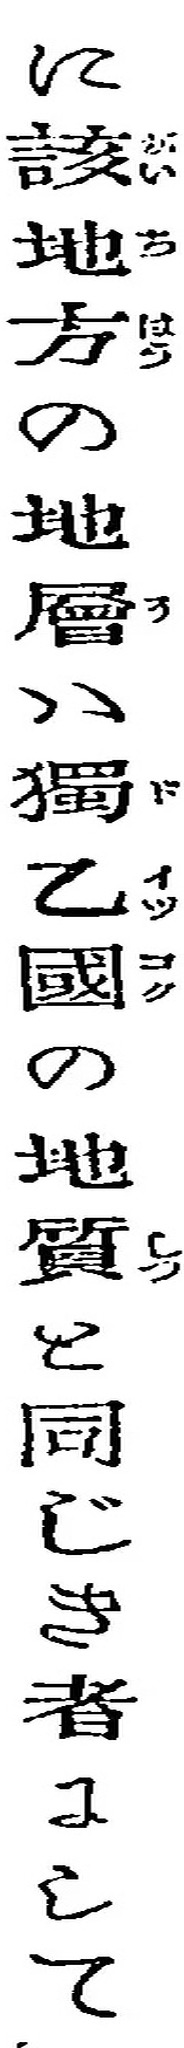に該地方の地層は獨乙國の地質と同じき者にして

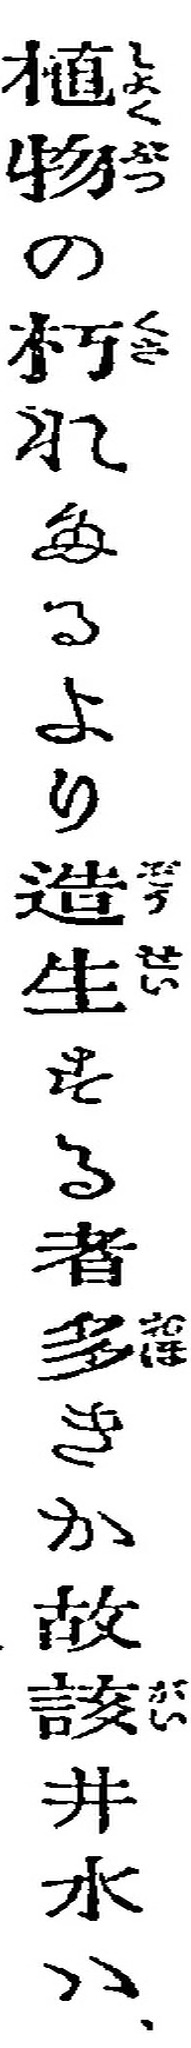植物の朽れたるより造生する者多きか故該井水は
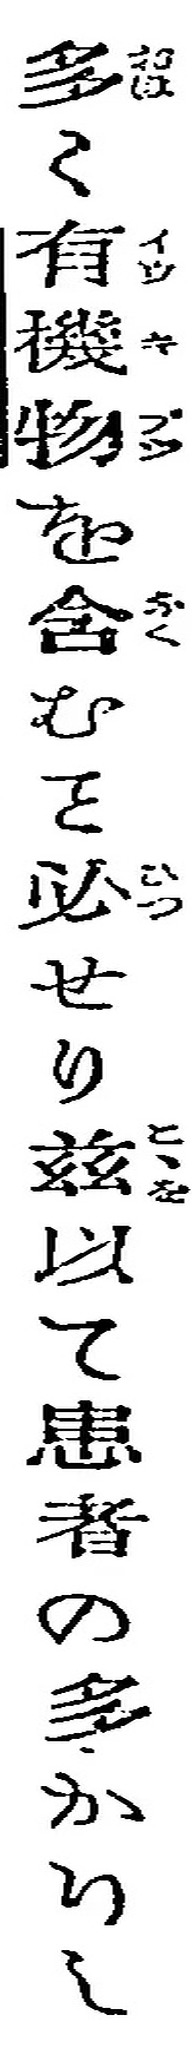多く有機物を含むこと必せり茲以て患者の多かりし
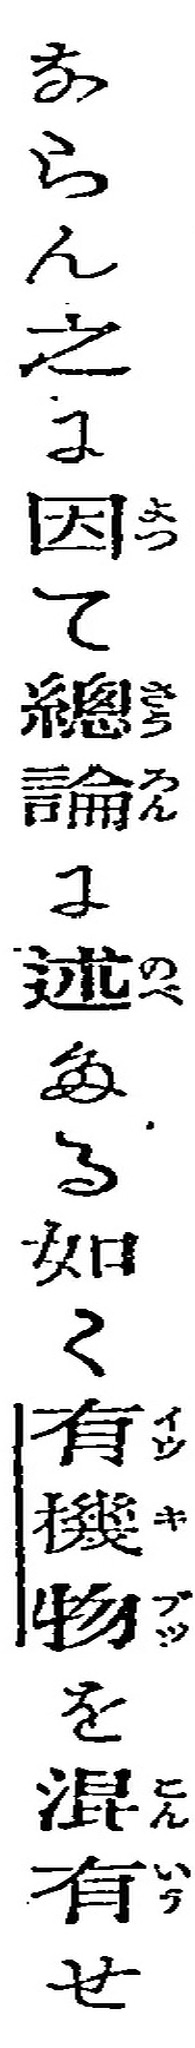ならん之に因て総論に述たる如く有機物を混有せ
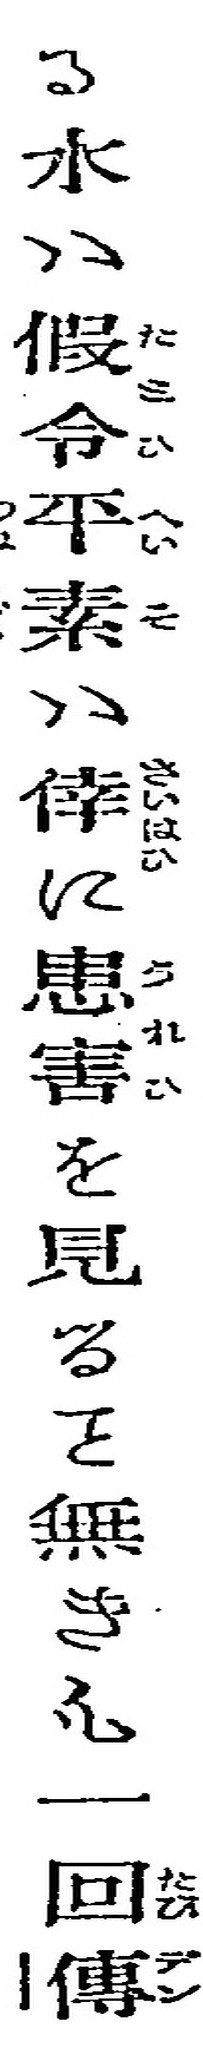る水は假令平素は倖に患害を見ること無きも一回傅
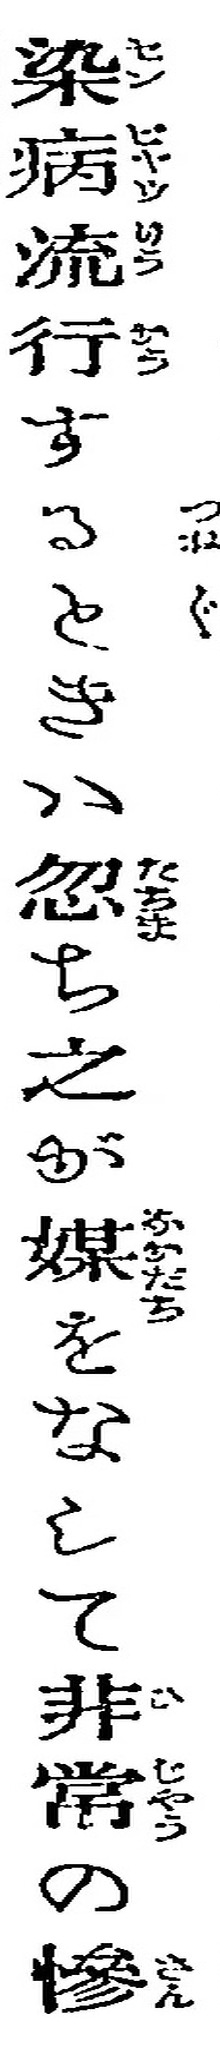染病流行するときは忽ち之が媒をなして非常の惨
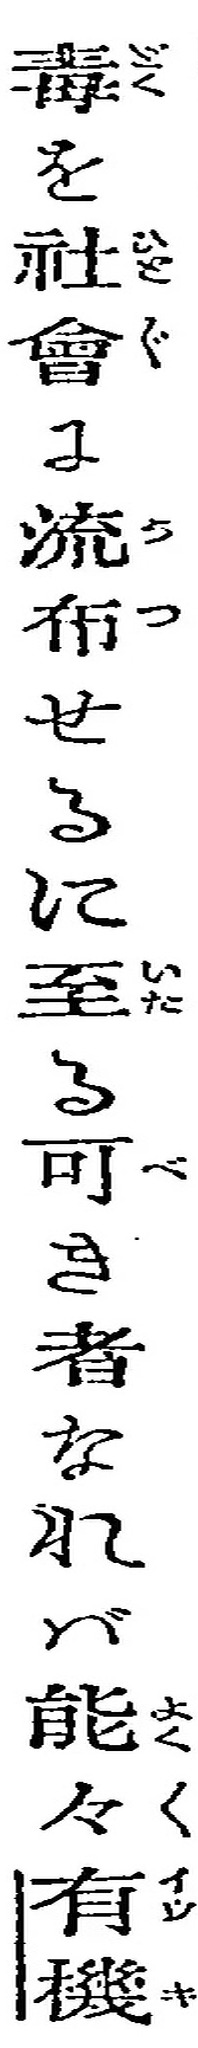毒を社会に流布せるに至る可き者なれば能々有機
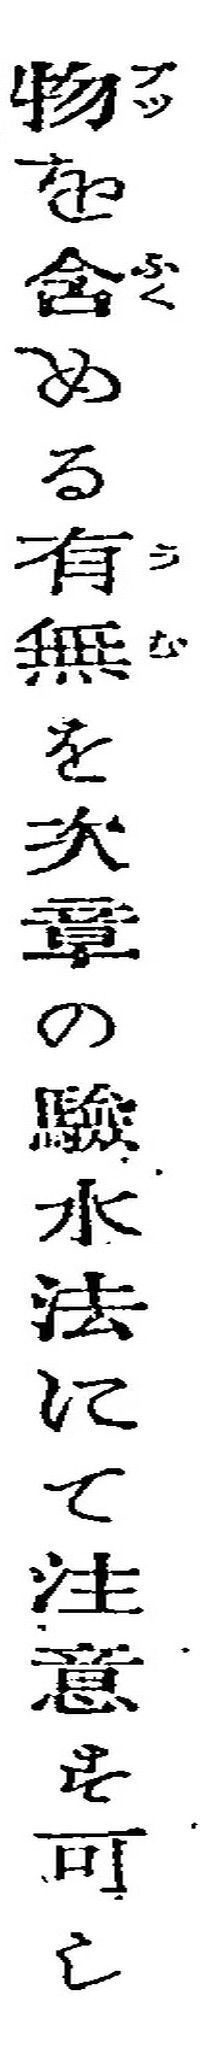物を含める有無を次章の験水法にて注意す可し
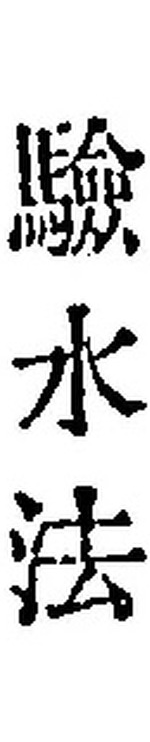験水法
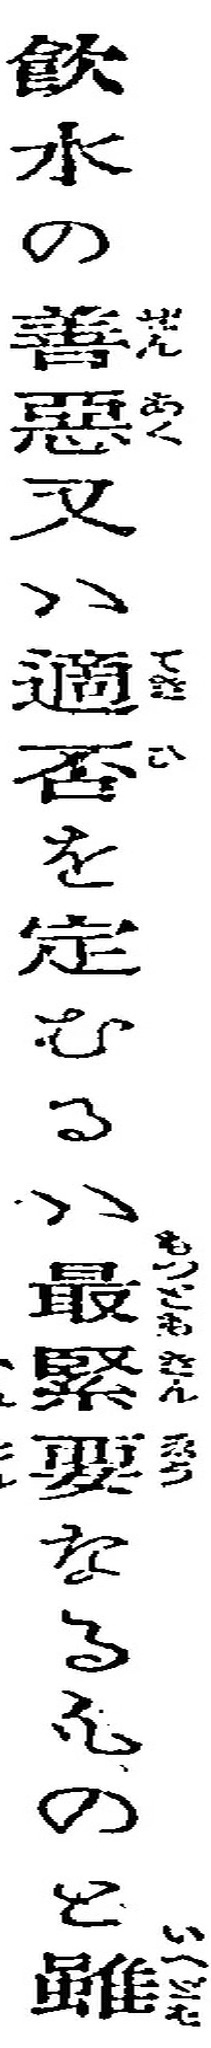飲水の善悪又は適否を定むるは最緊要なるののと雖
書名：飲水の心得 : 伝染病の予防
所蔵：国立国会図書館 National Diet Library, JAPAN
